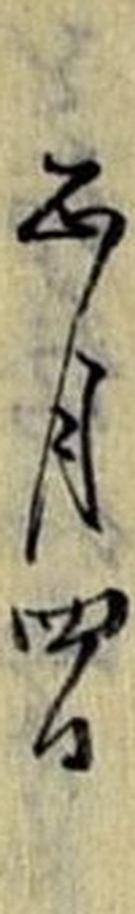正月四日
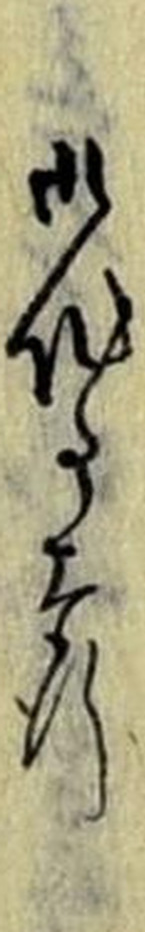御作事奉行
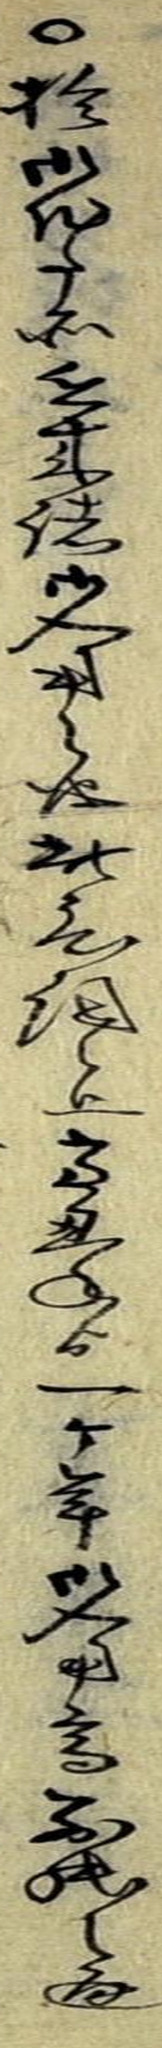○於御作事所近来諸入用之儀此度調之上当丑年ゟ一ヶ年御入用高別紙之通
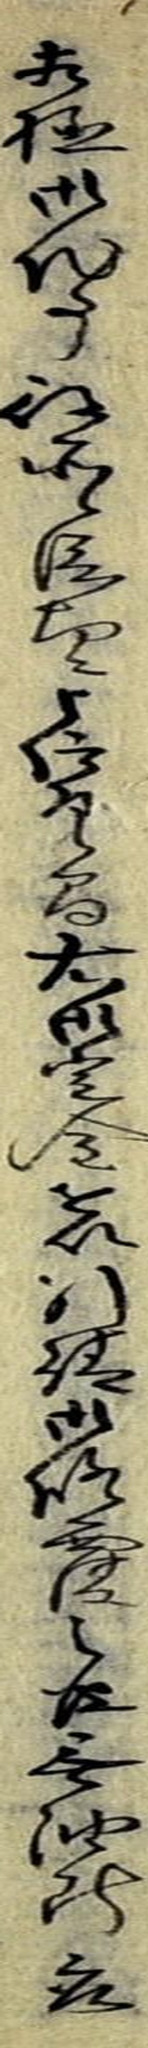相極御作事役所へ渡切に被仰付候間右御定金を以引請御修覆之儀無由断取
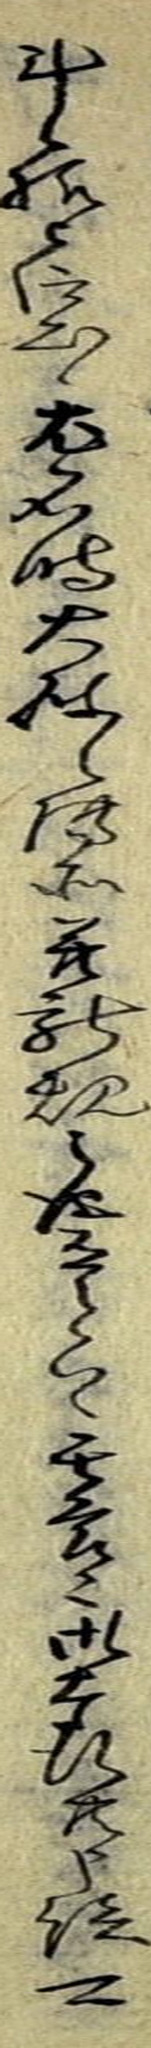斗候様被仰出候尤不時大破之場所并新規之儀有之候はヽ其節々御奉行共申談可
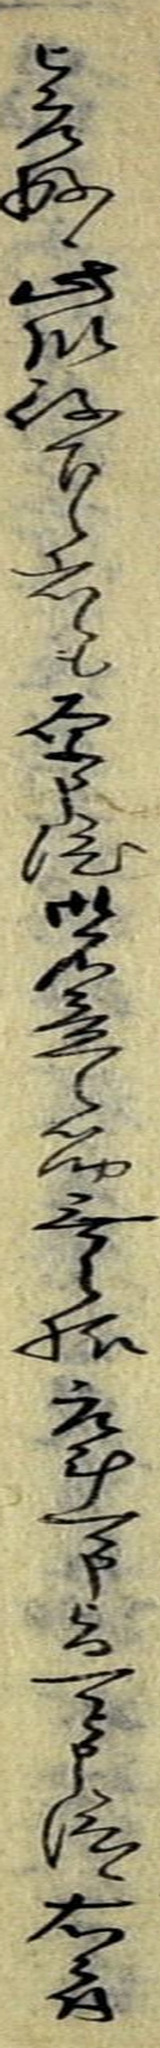被取扱候此段役下之者へも厚申渡御不益之筋無之様取斗可申旨可被申渡候右に付
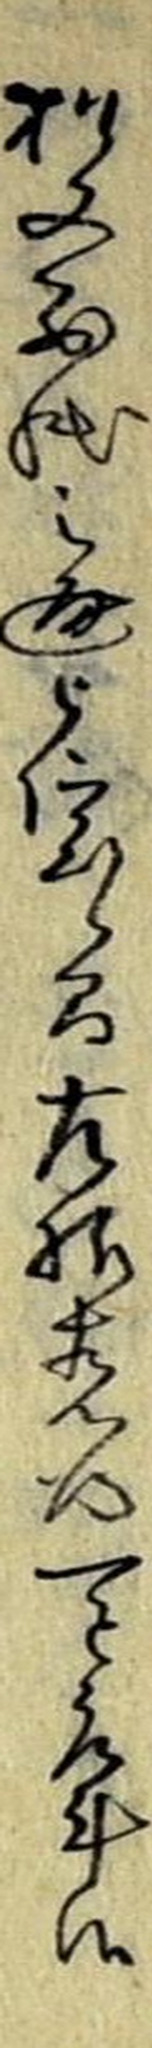猶又別紙之通被仰出候間左様相心得可被取斗候
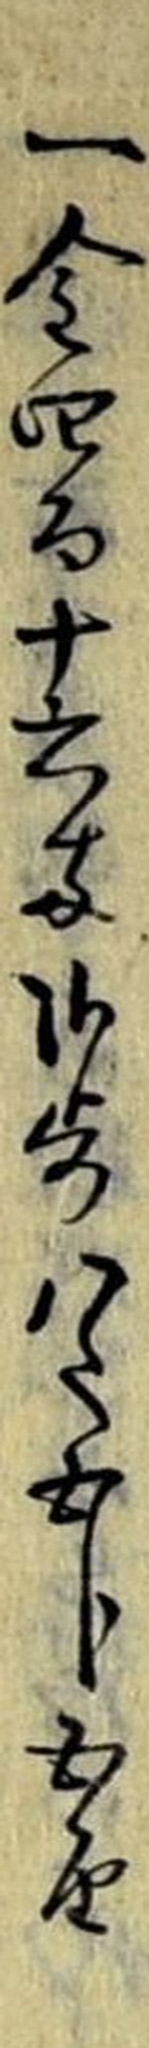一金四百十六両弐歩八匁五分五厘

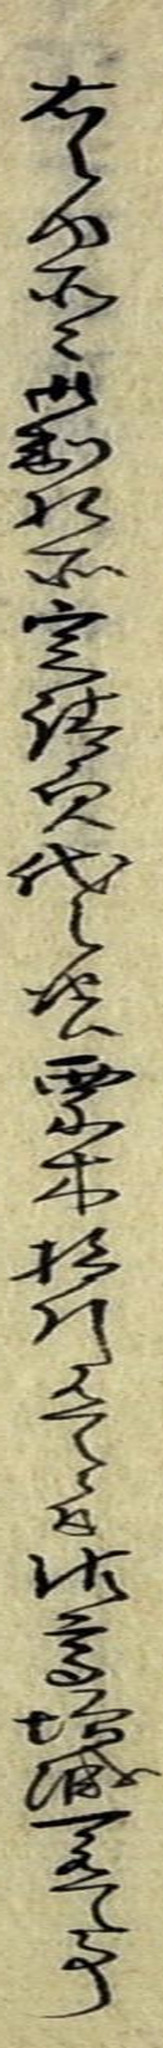右之内所々御割折所定請負代之儀は栗木指引有之に付銀高増減可有之事
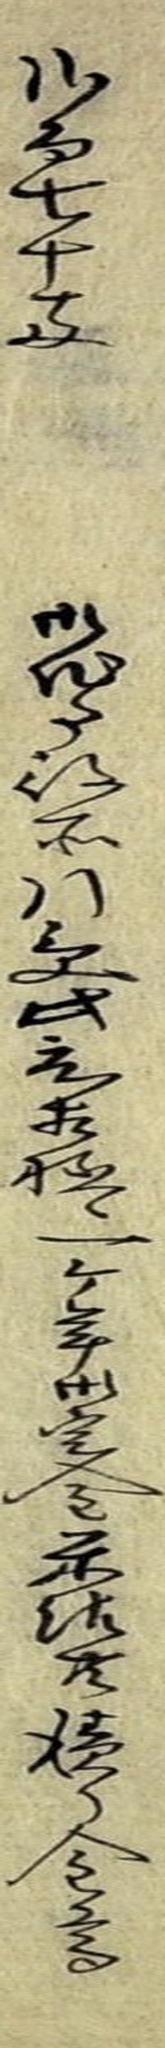弐百七十両御作事役所引受此度相極候一ヶ年御定金米銀共積り金高
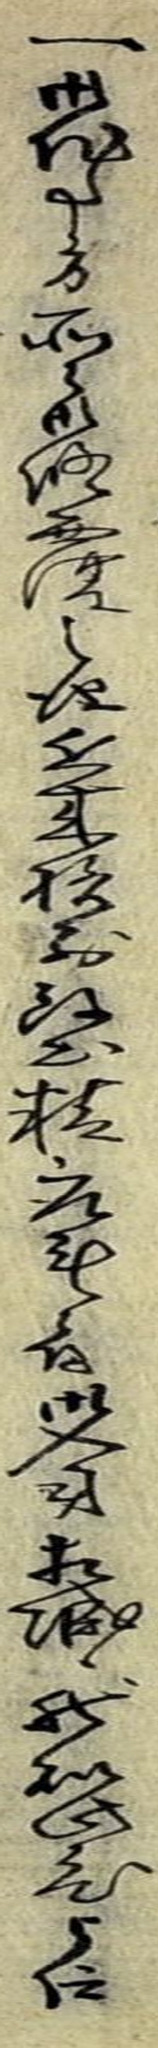一御作事方所々御修覆之儀近来格別致出精取斗候に付御入用相減候然処此度被仰
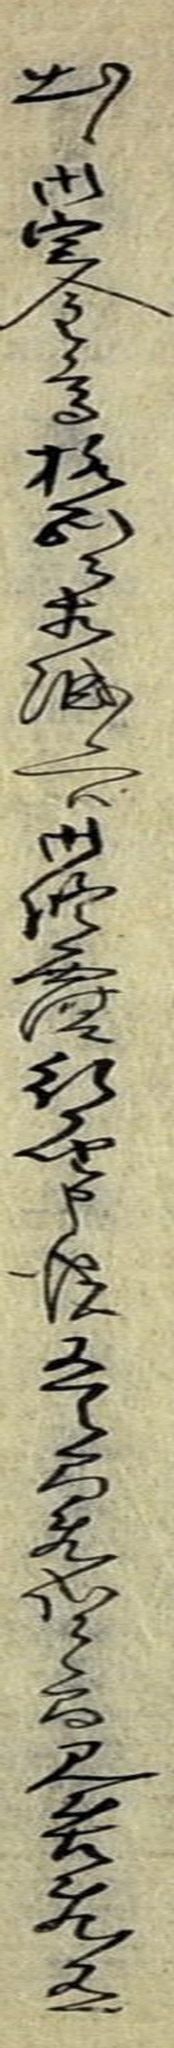出候御定金高格別に相減候へは御修覆行届申儀は有之間敷哉に候間見苦敷有
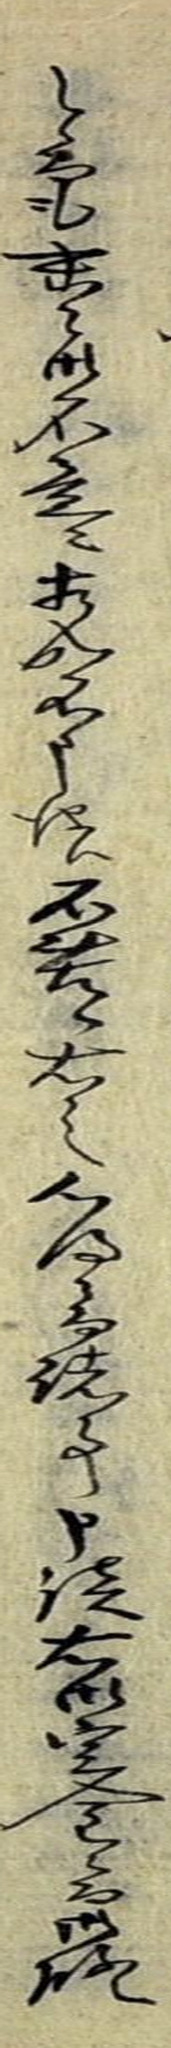之候而も末々御不益に相成不申儀は不苦候右之心得に而諸事申談右御定金に而御修
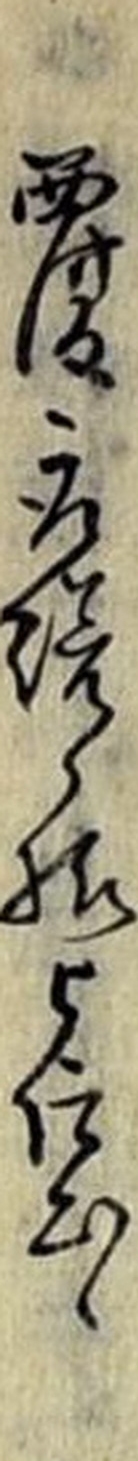覆取繕候様被仰出候
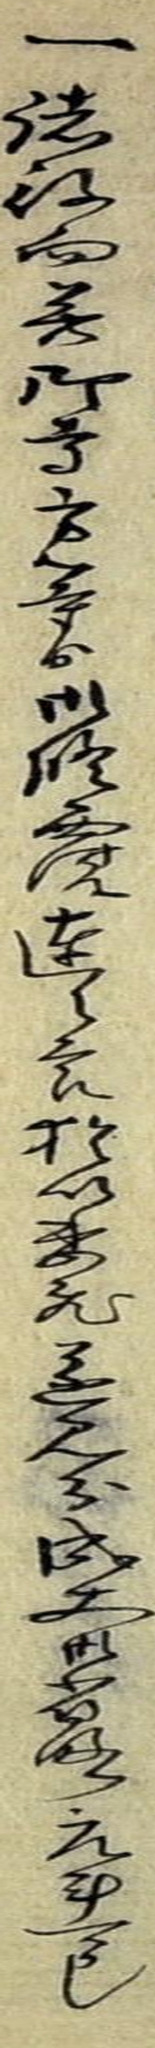一諸役向并御寺方へ寺？ゟ御修覆達候節猶以委敷遂見分成丈御省略取斗可申候
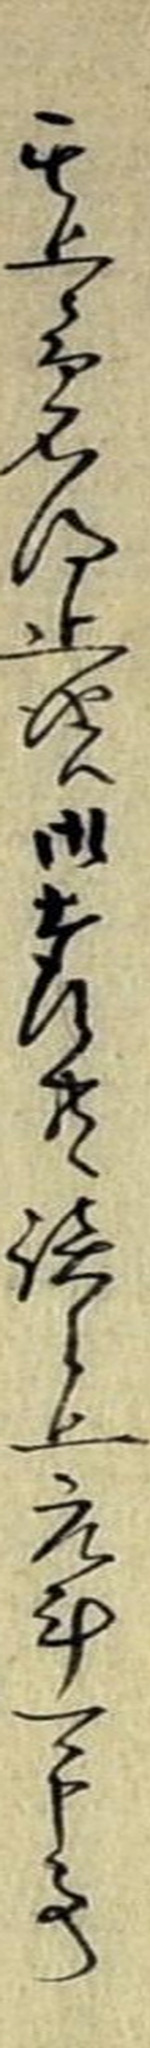其上に而不得止儀は御奉行共へ談之上取斗可申事
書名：命令之部 四
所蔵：福井県文書館 Fukui Prefectural Archives
